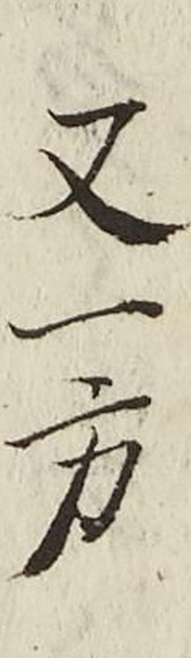又一方
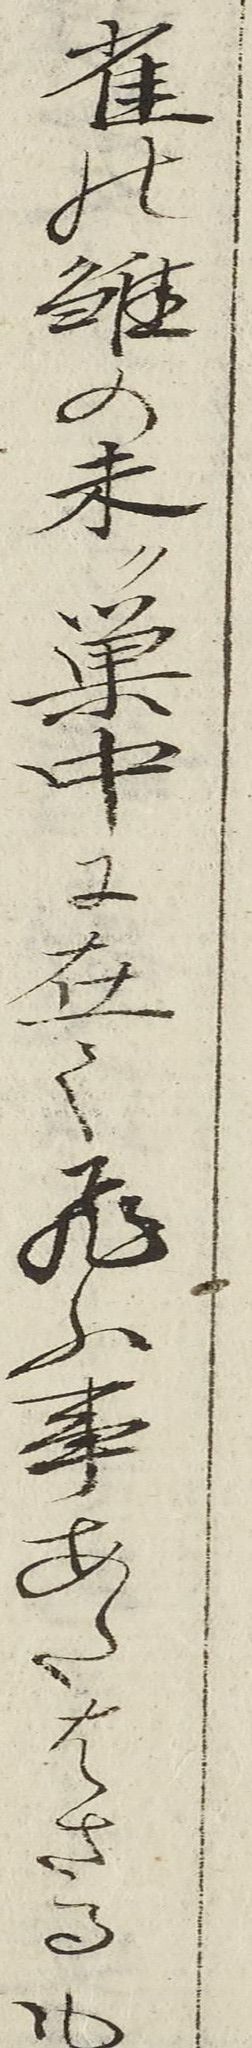雀の雛の未タ巣中に在て飛ふ事あたはさるも
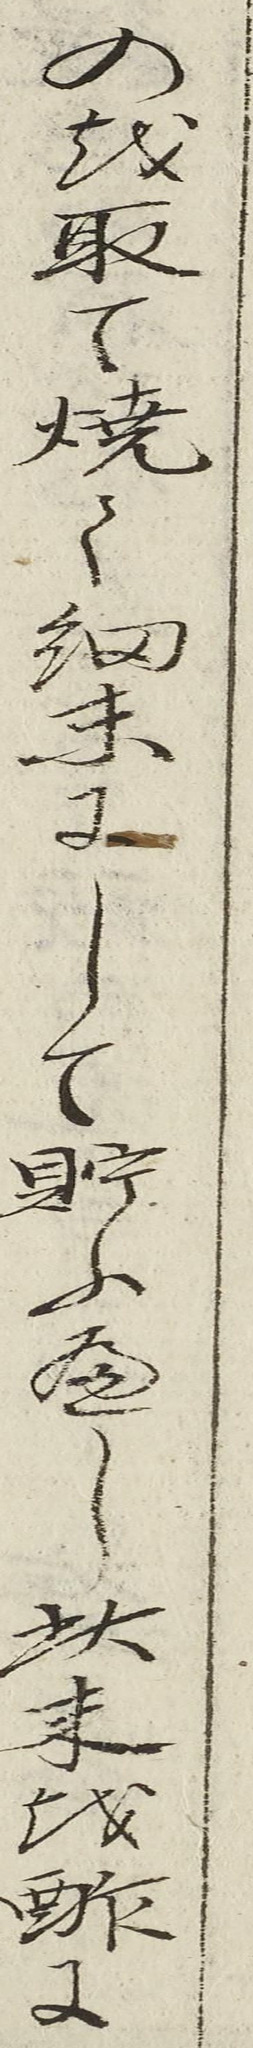のを取て焼て細末にして貯ふへし此末を酢に
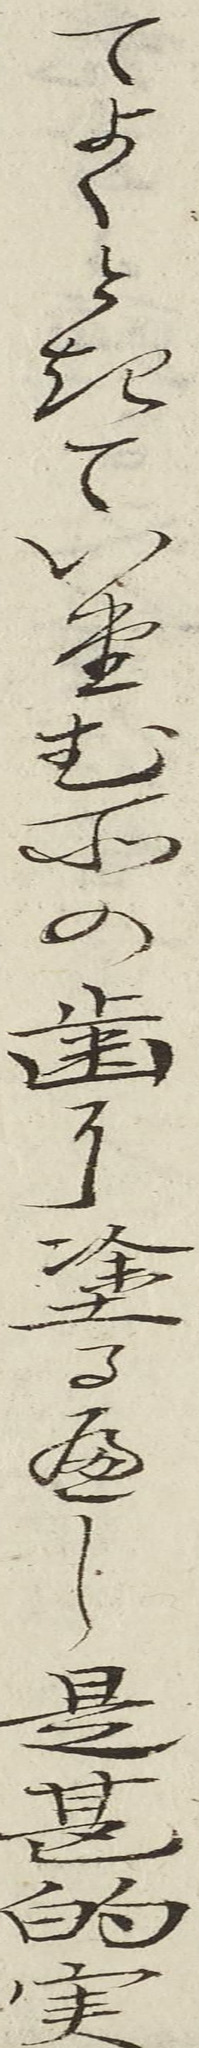てよくときていたむ所の歯に塗るへし是甚的実
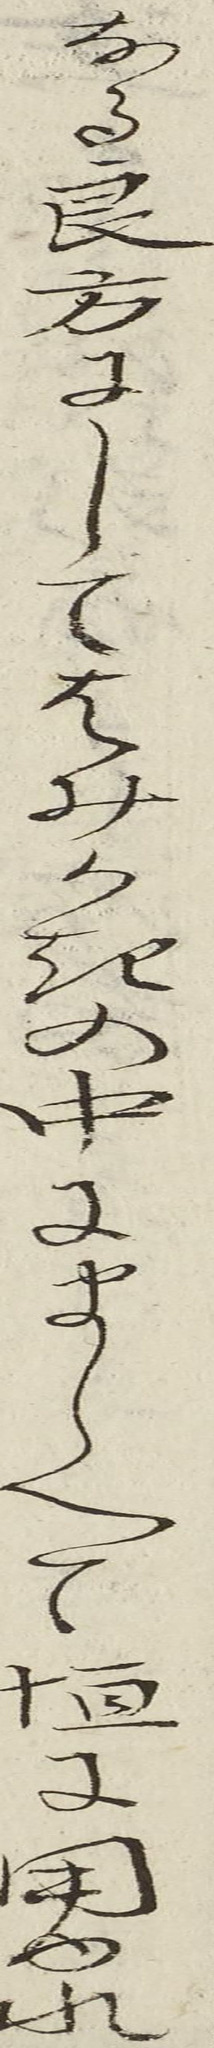なる良方にしてはみかきの中にましへて恒に用ゆれ
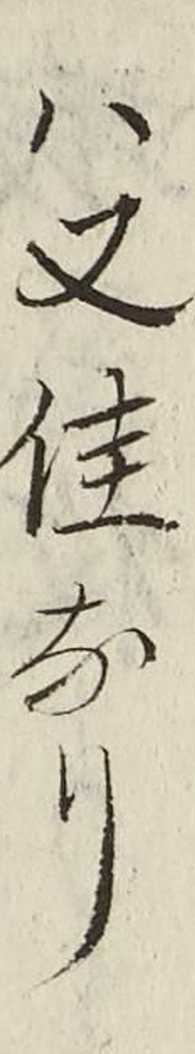ハ又佳なり
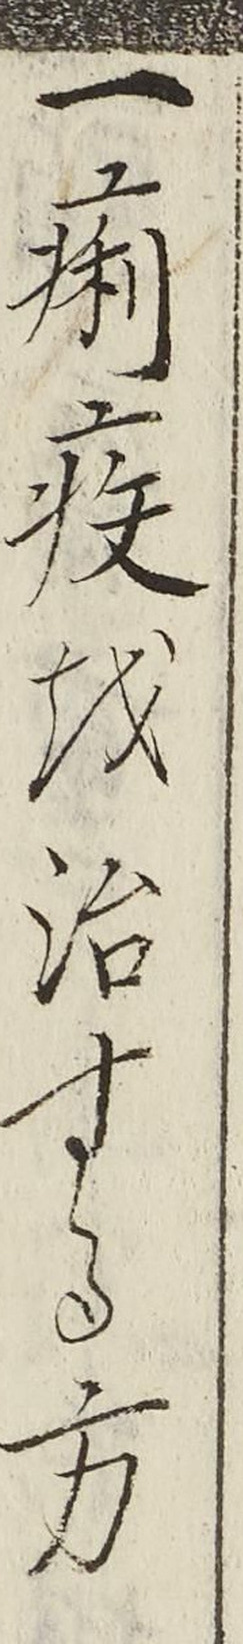一痢疾を治する方
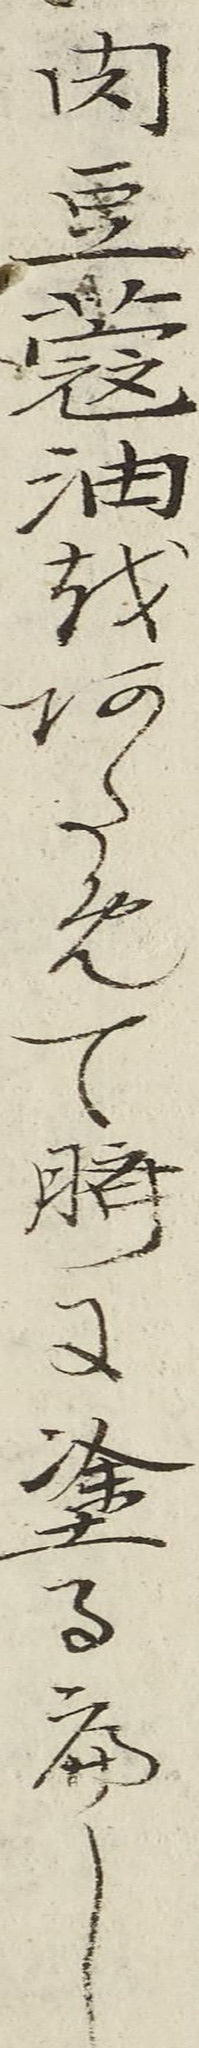肉豆蔲油をあたゝめて臍に塗るへし
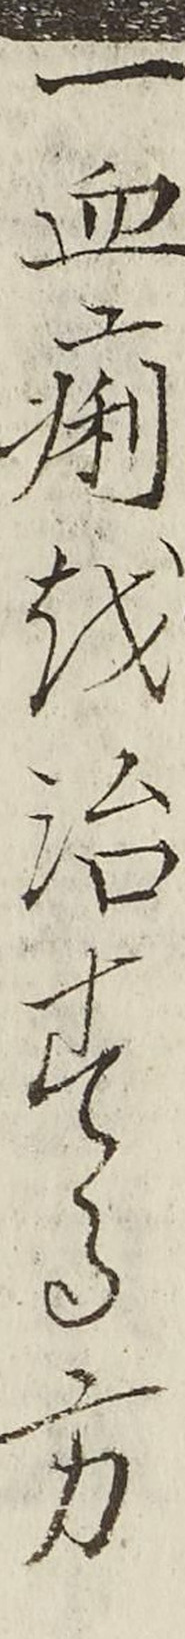一血痢を治する方
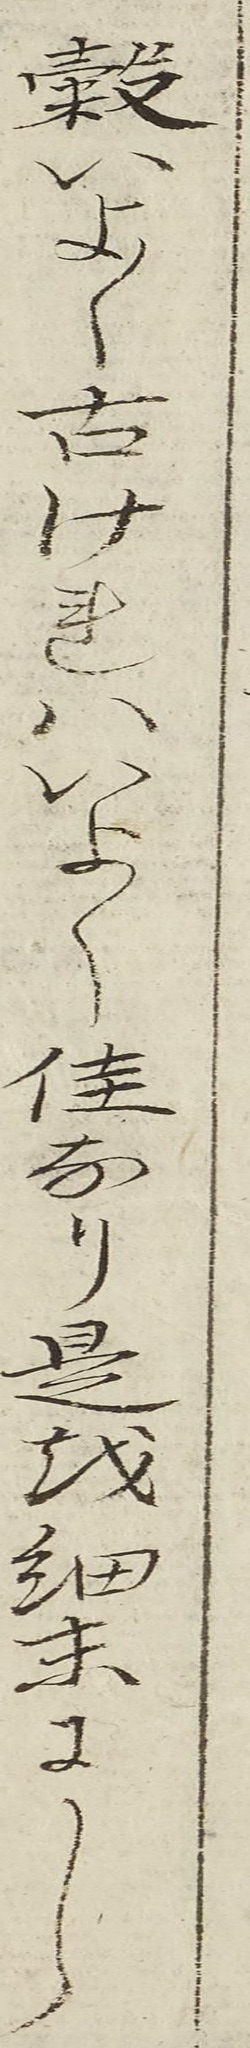穀いよ〳〵古けれハいよ〳〵佳なり是を細末にし
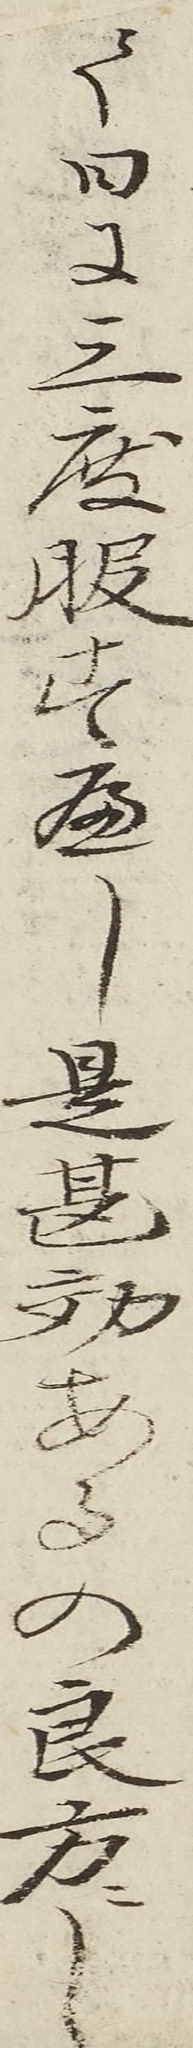て日に三度服すへし是甚効あるの良方二し

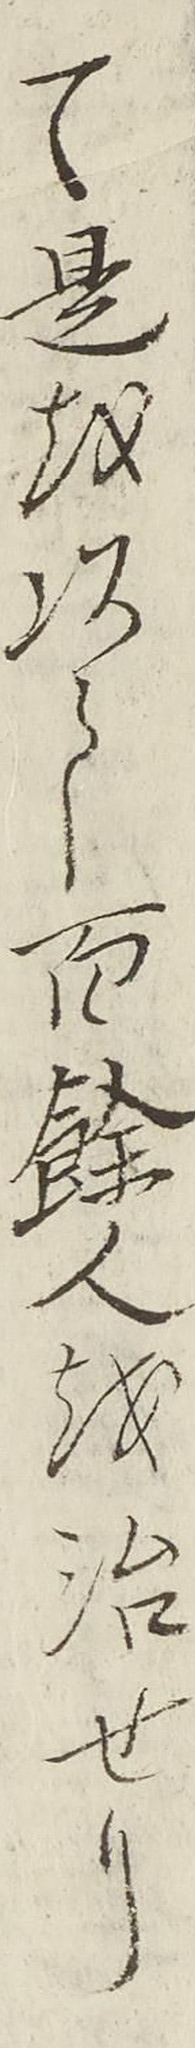て是を以て百余人を治せり
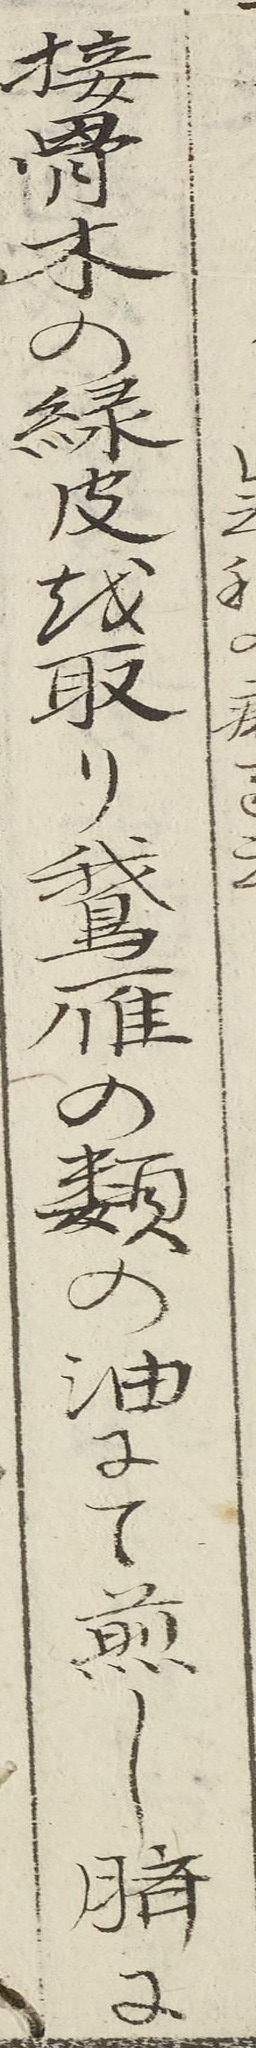接骨木の緑皮を取り鵞雁の類の油にて煎し臍に
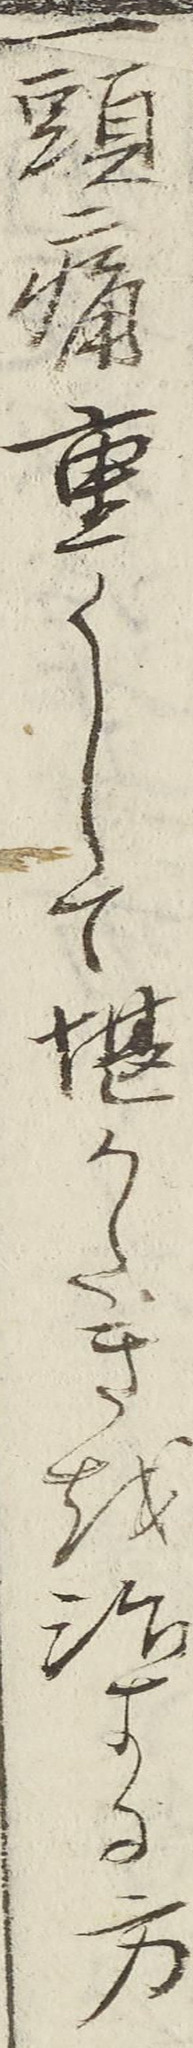一頭痛重くして堪かたきを治する方
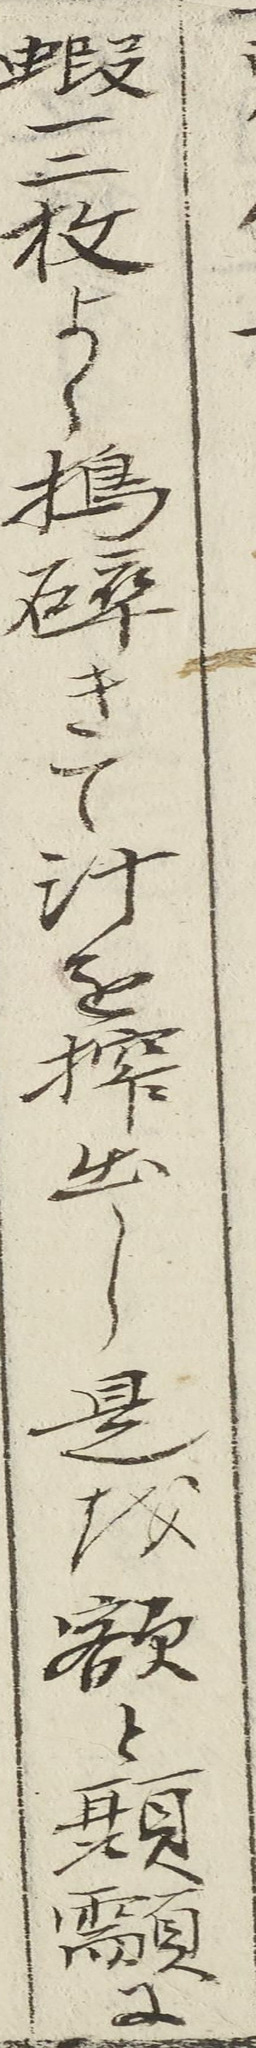蝦一二枚よく搗砕きて汁を搾出し是を額と頸顬に
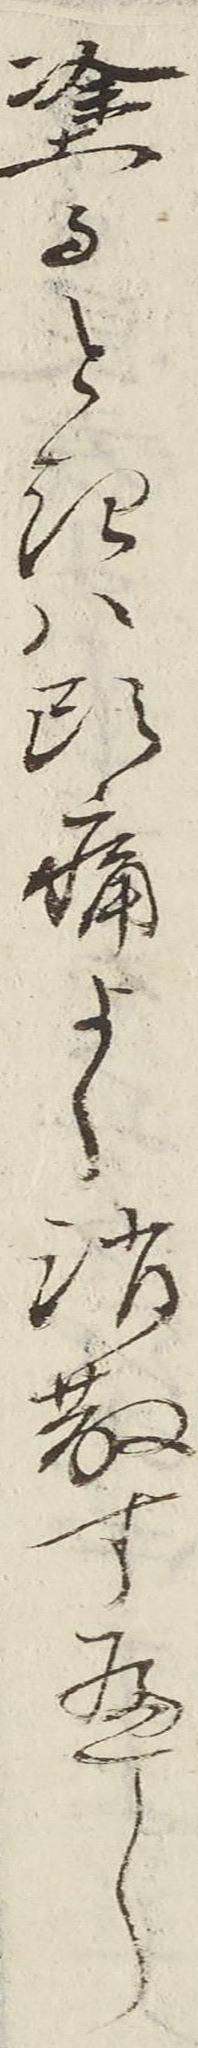塗るときハ即痛よく消散すへし
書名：西洋雜記　坤
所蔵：東京大学地震研究所図書室 Earthquake Research Institute Library, The University of Tokyo, JAPAN
